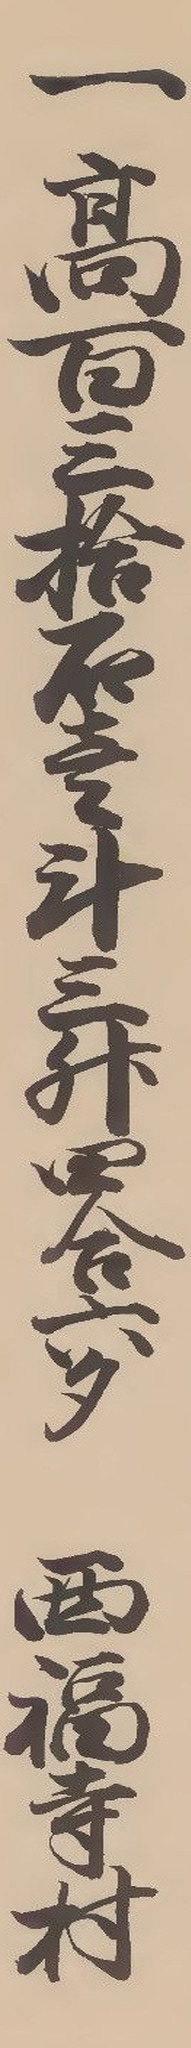一高百三拾石壱斗三升四合六勺西福寺村
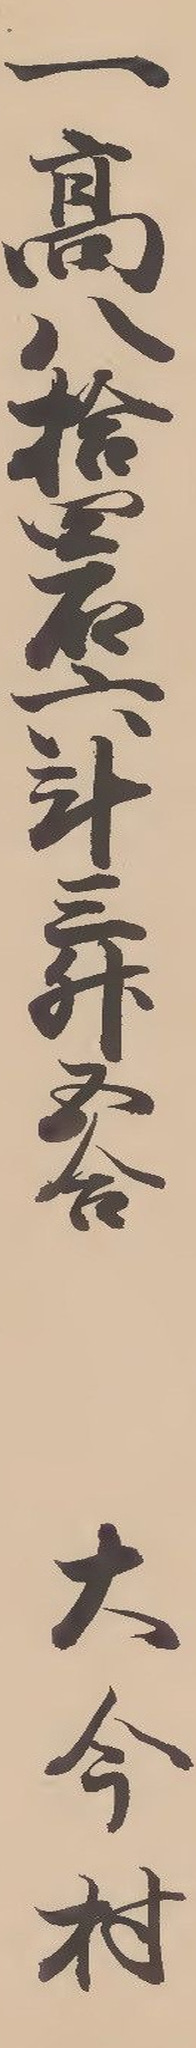一高八拾四石六斗三升五合大今村
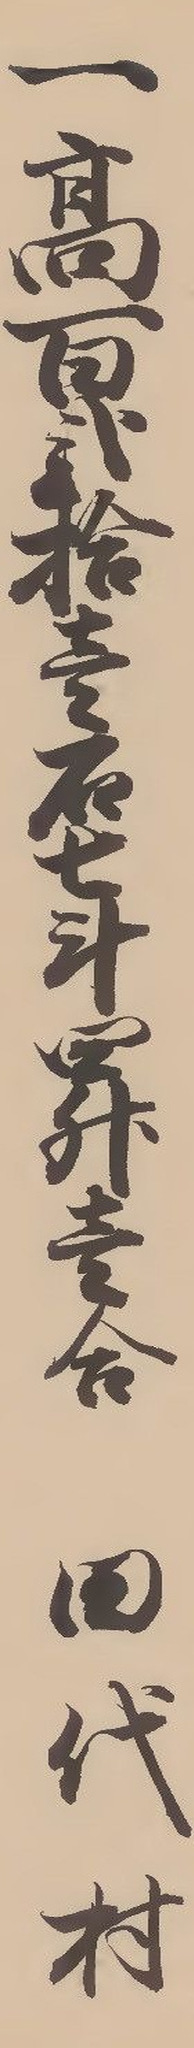一高百弐拾壱石七斗四升壱合田代村
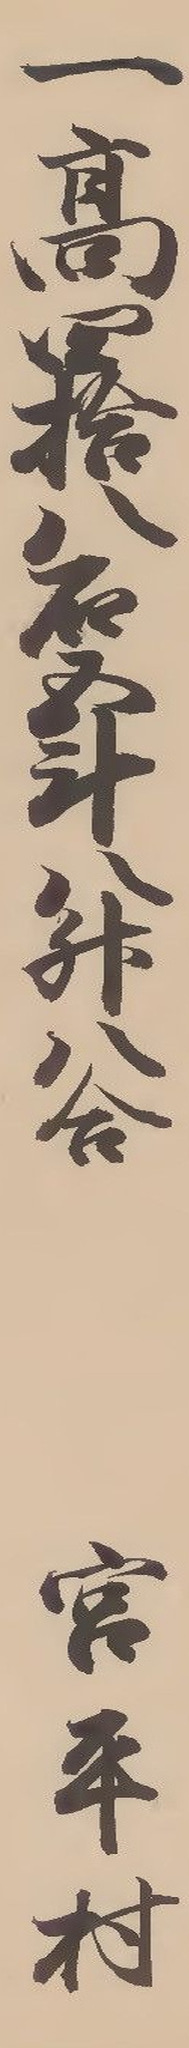一高四拾八石五斗八升八合宮平村
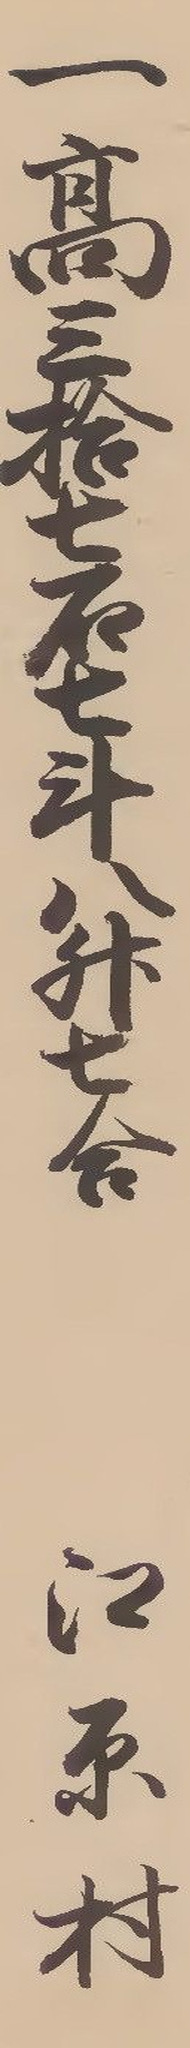一高三拾七石七斗八升七合江原村

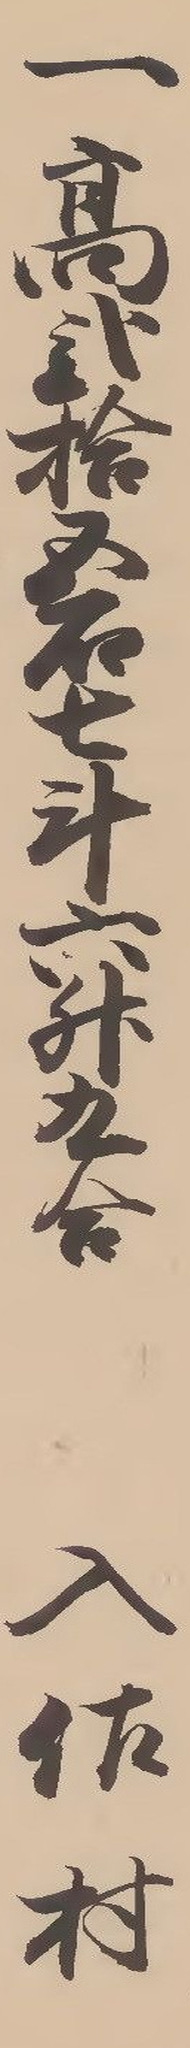一高弐拾五石七斗六升九合入佐村
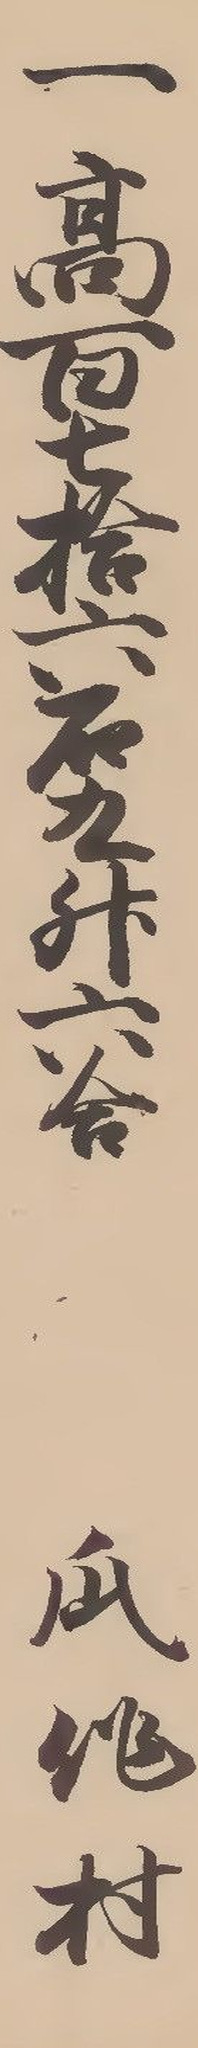一高百七拾六石九升六合瓜作村
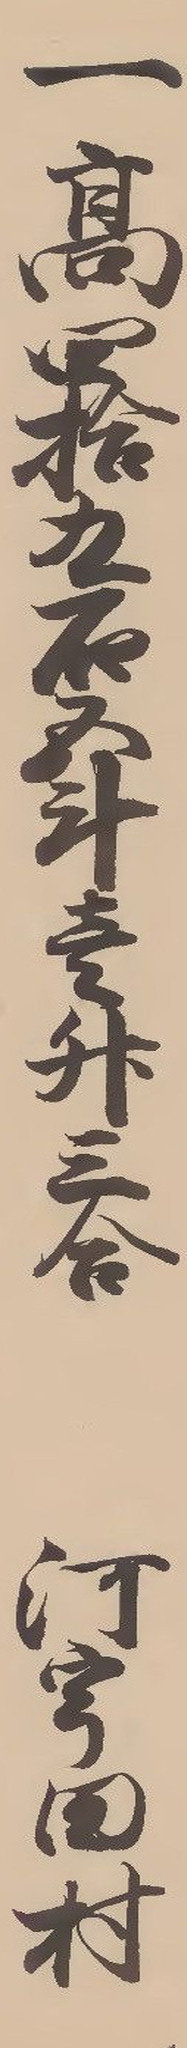一高四拾九石五斗壱升三合河宇田村
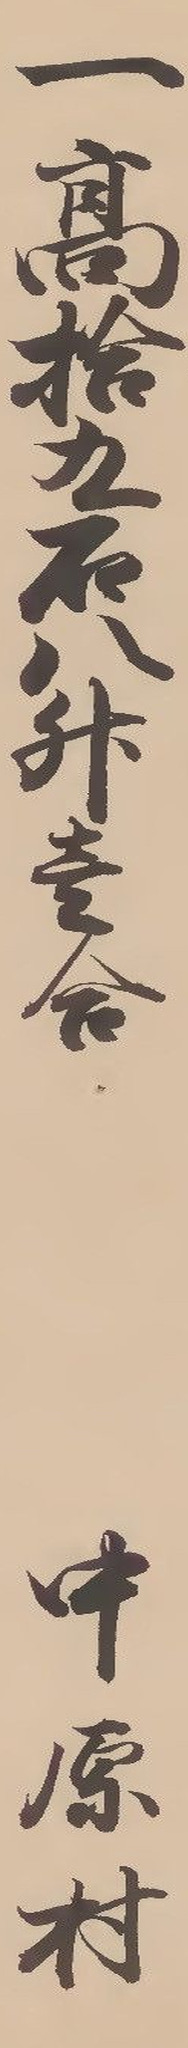一高拾九石八升壱合中原村
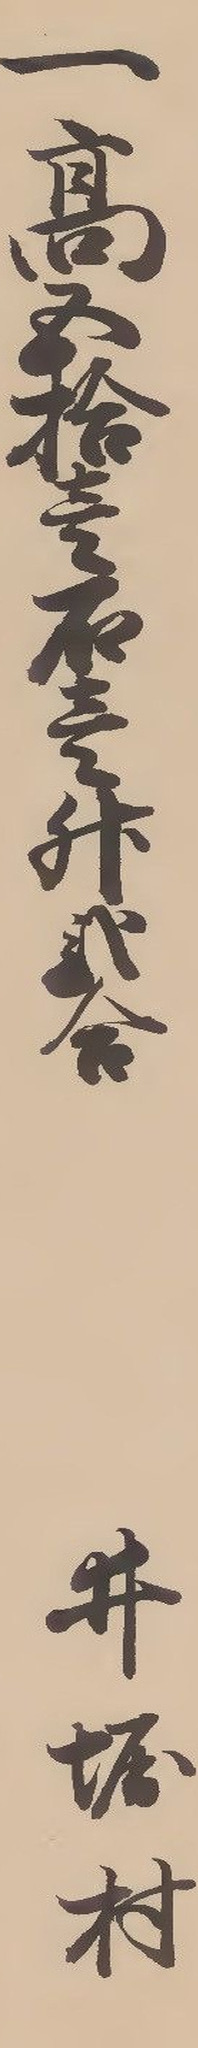一高五拾壱石壱升弐合井堀村
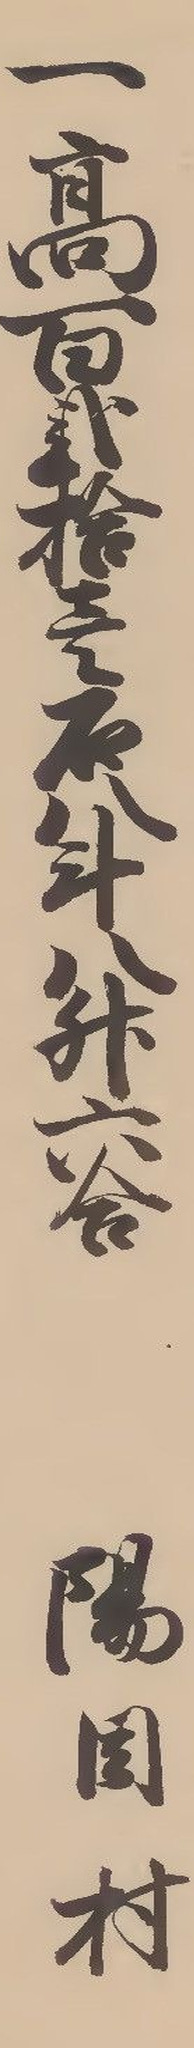一高百弐拾壱石八斗八升六合陽目村
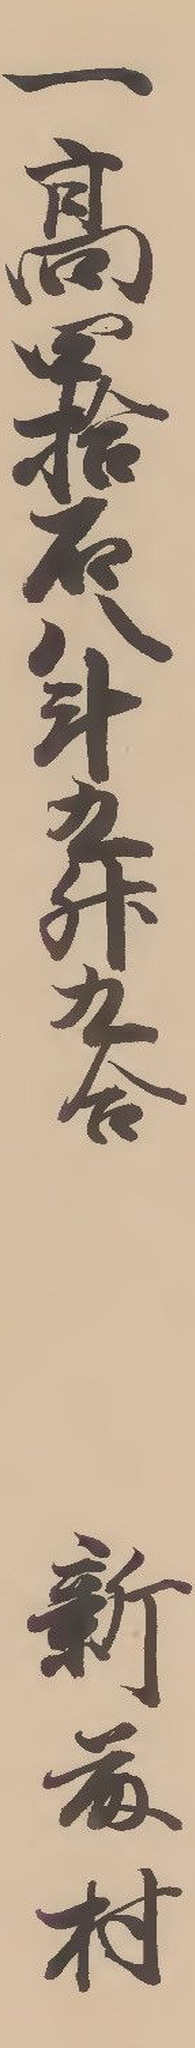一高四拾石八斗九升九合新藤村
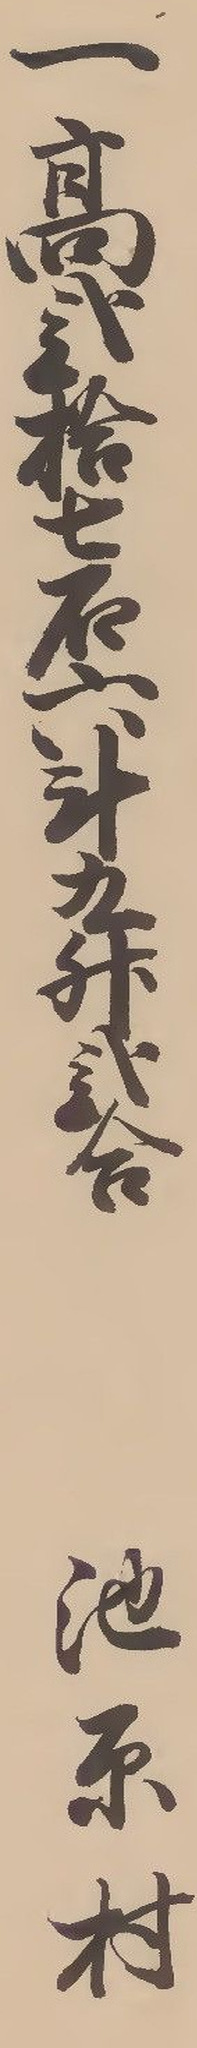一高弐拾七石六斗九升弐合池原村

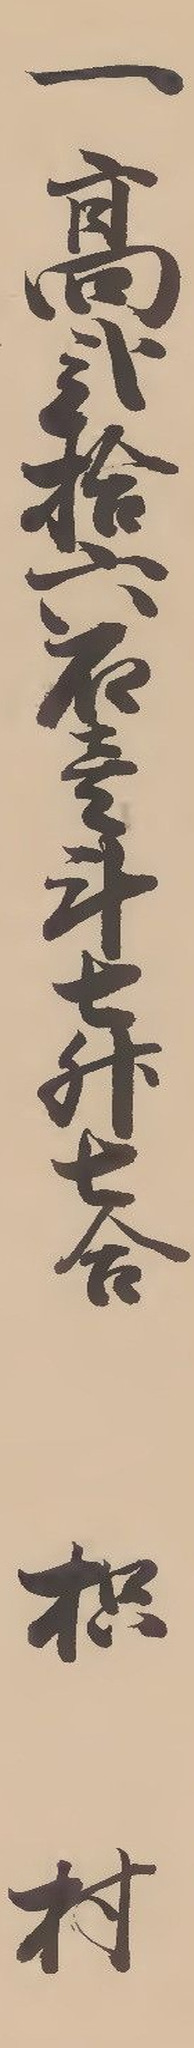一高弐拾六石壱斗七升七合枳村
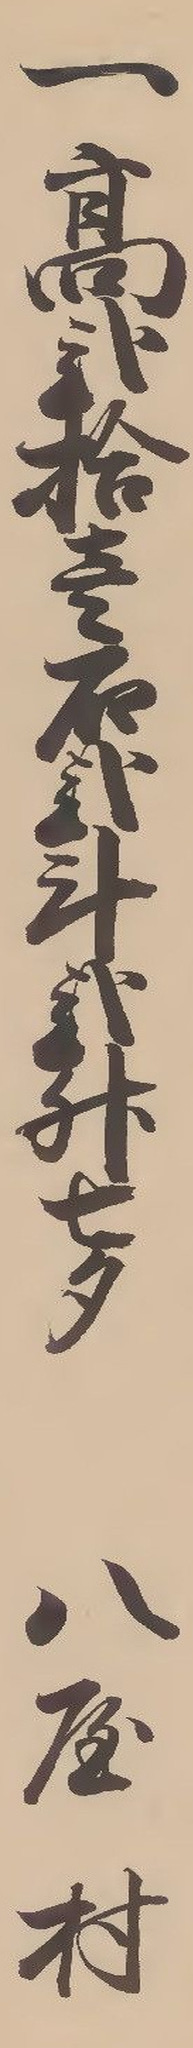一高弐拾壱石弐斗弐升七勺八屋村
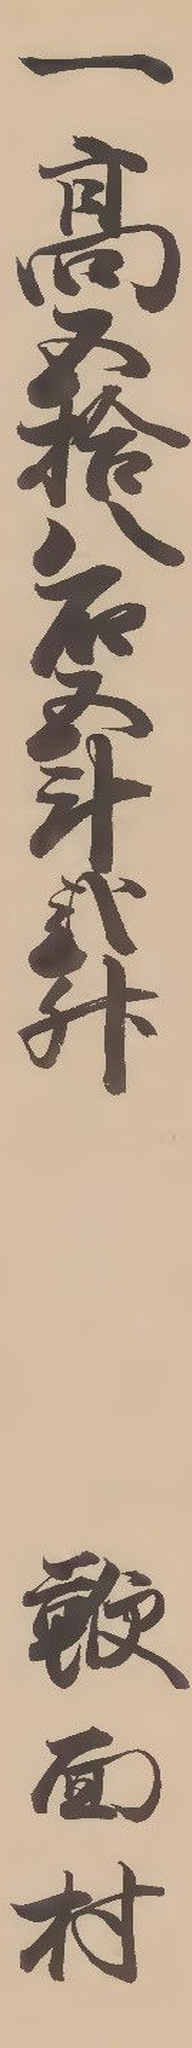一高五拾八石五斗弐升鞭面村
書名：豊後国郷帳
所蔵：国立公文書館 National Archives of Japan
